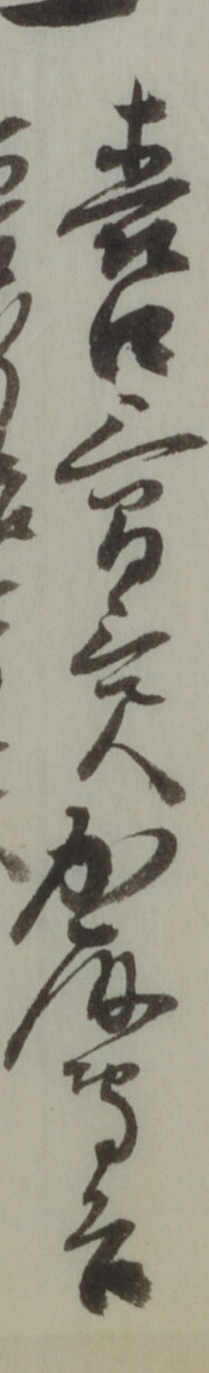一表口三間三尺加藤守吉
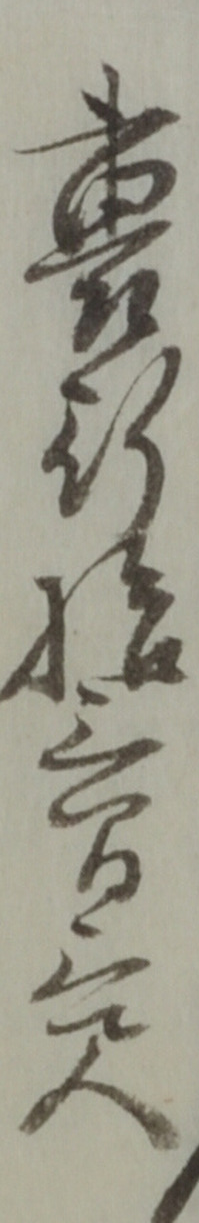裏行拾三間三尺
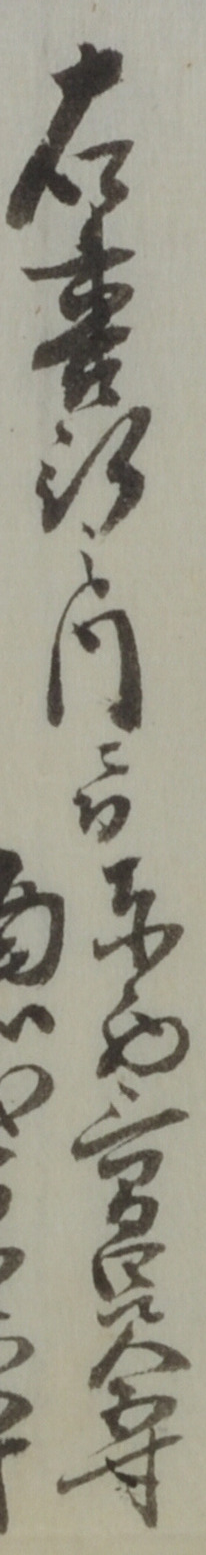右裏行之内ニ而東西三間四尺五寸
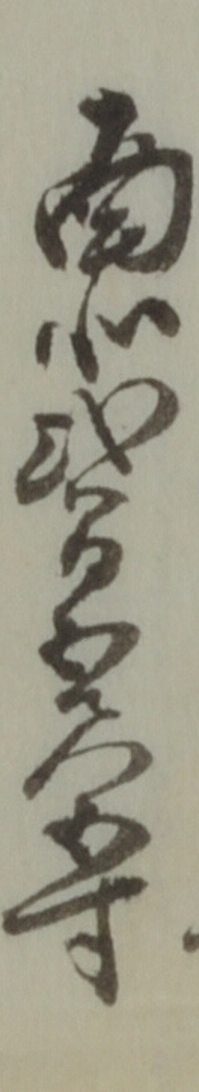南北弐間五尺五寸
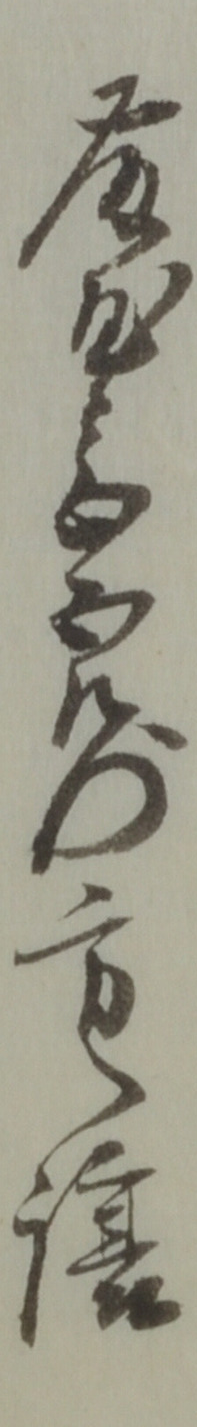藤屋ニ而五左衛門方へ譲
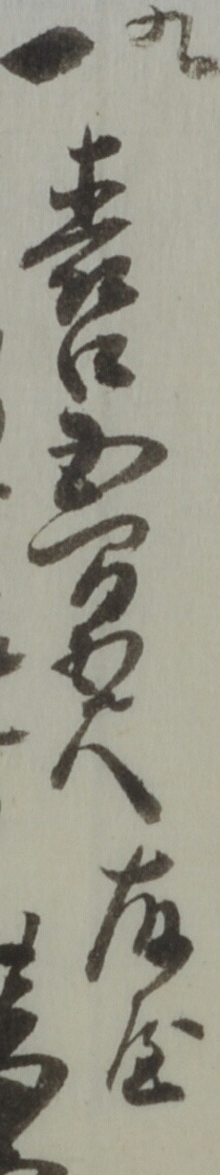一表口五間五尺藤屋
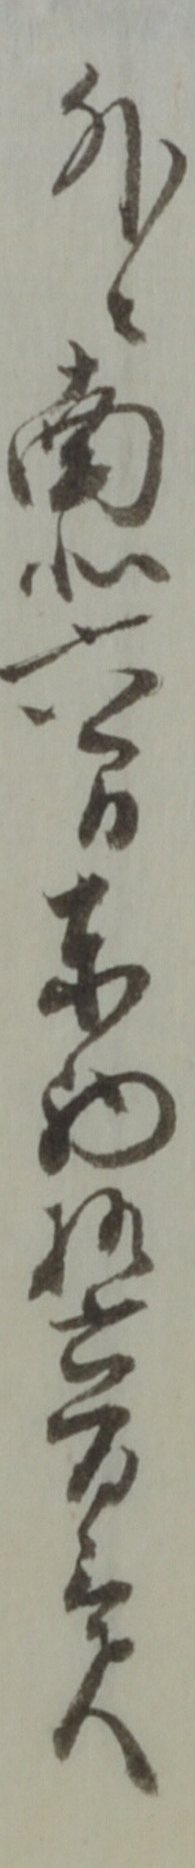外ニ南北六間東西拾六間壱尺
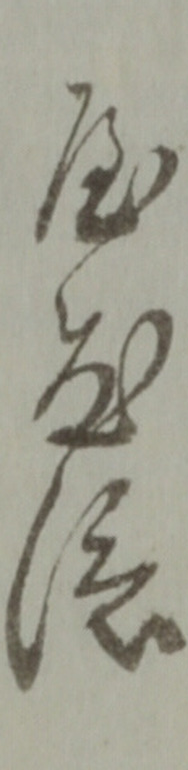屋敷添
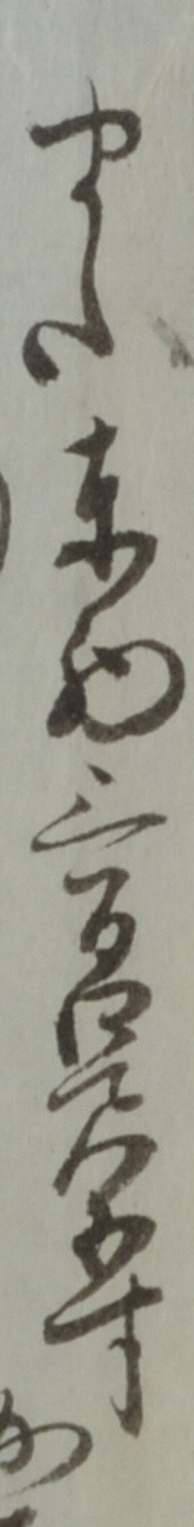また東西三間四尺五寸
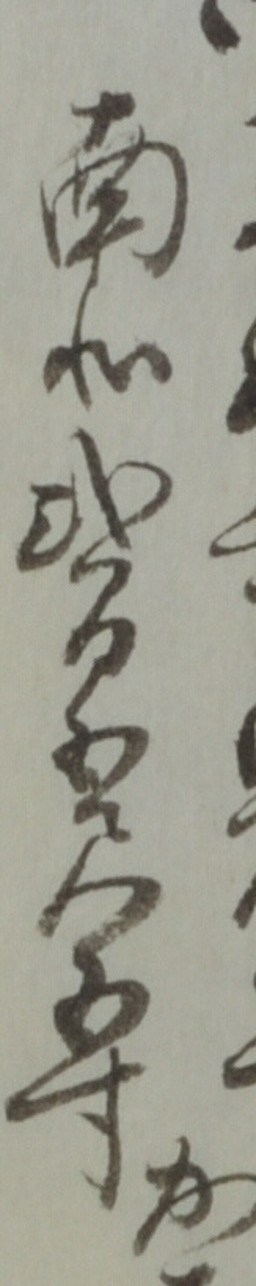南北弐間五尺五寸
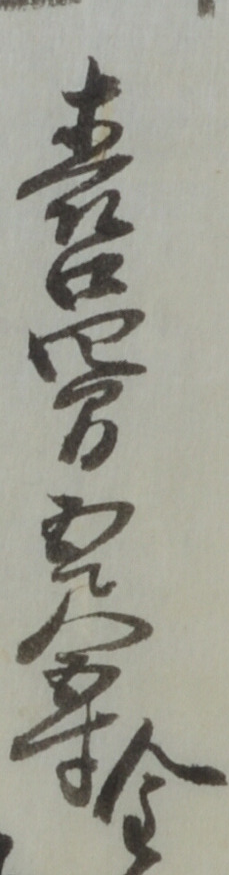南北弐間五尺五寸
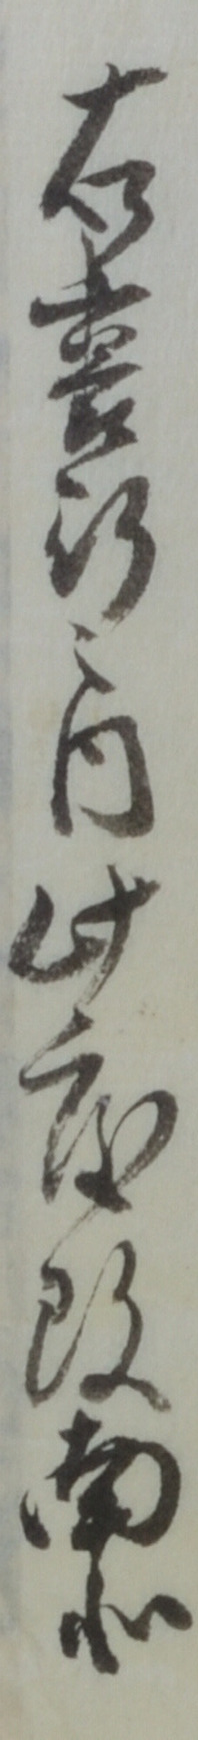右裏行之内此度改南北

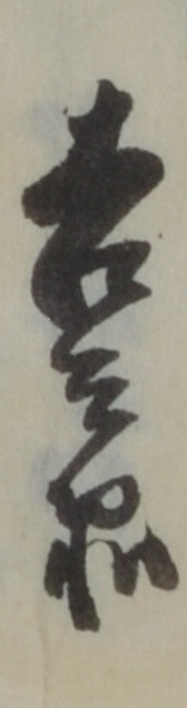左兵衛
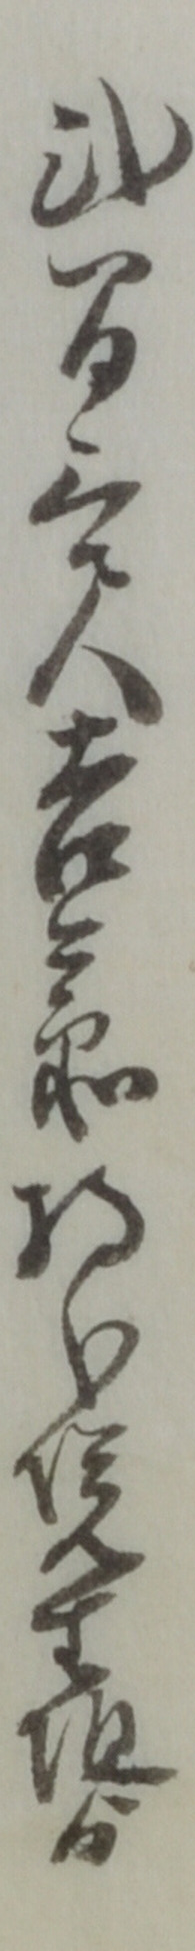弐間三尺吉兵衛持分院生垣ゟ
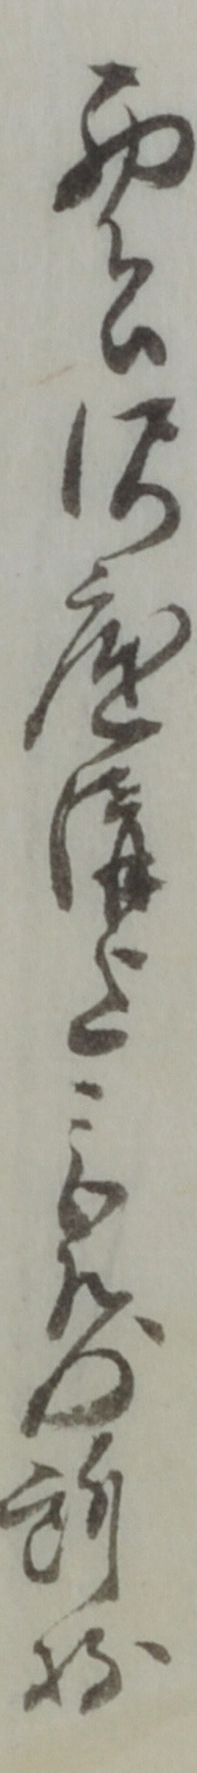西は沢底溝迄甚左衛門所持
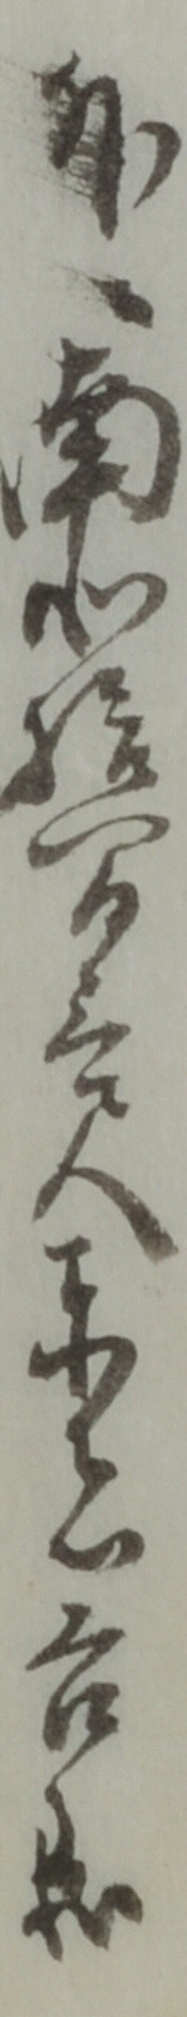外ニ南北拾間三尺東は吉兵衛
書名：屋敷表口裏行書上
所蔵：伊那市立高遠町図書館・合同会社AMANE
